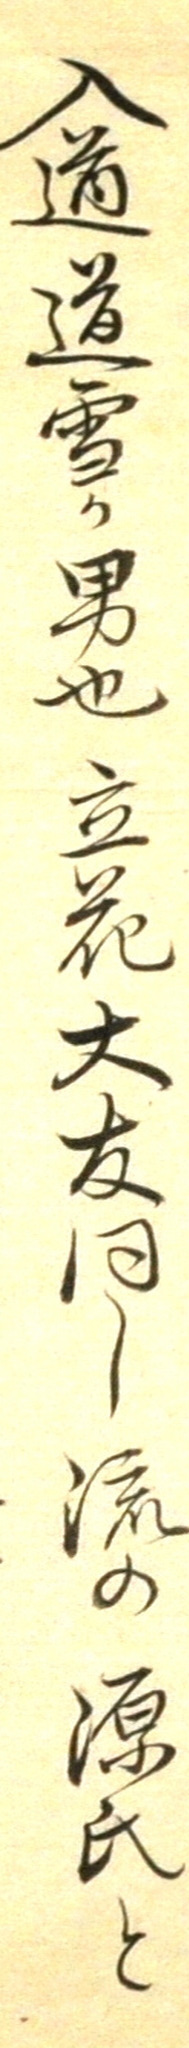入道道雪か男也立花大友同し流の源氏と
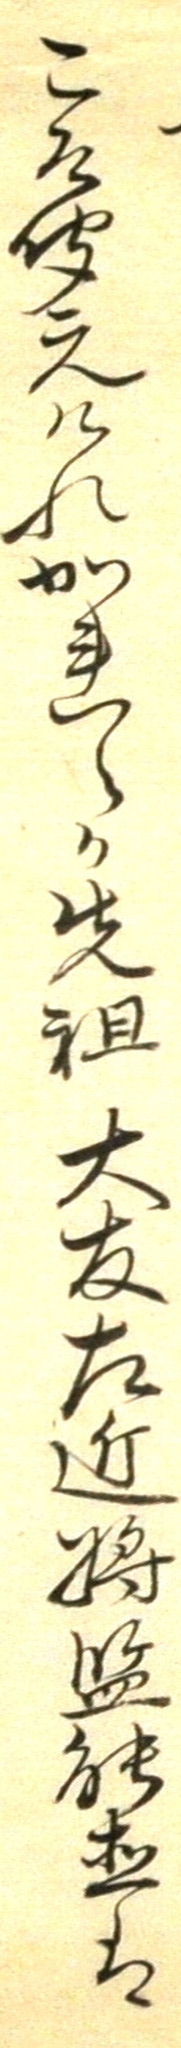こそ聞えけれかれらか先祖大友左近将監能直は
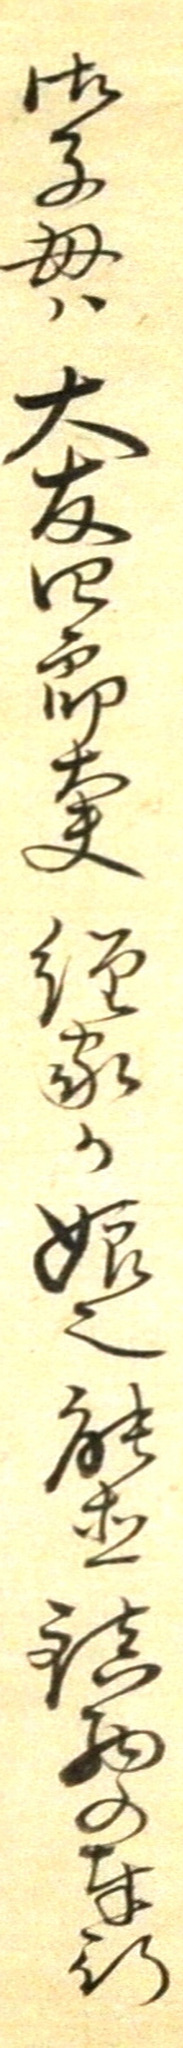御子母は大友四郎大夫経家か娘也能直鎮西の奉行
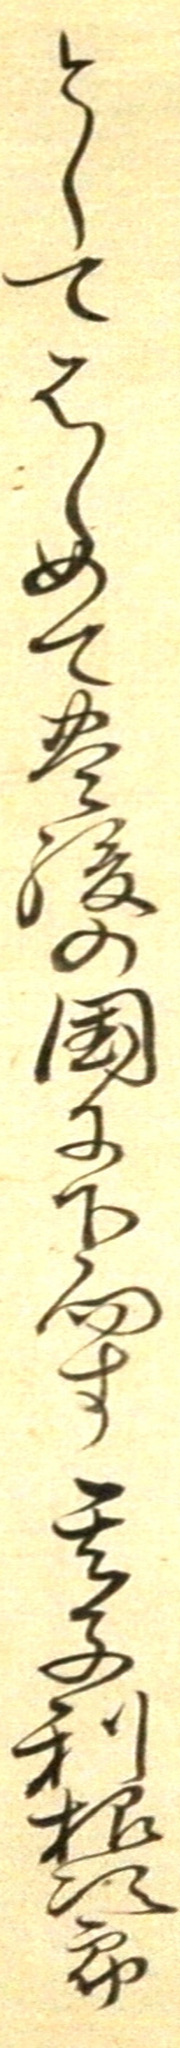としてはしめて豊後の国に下向す其子利根次郎
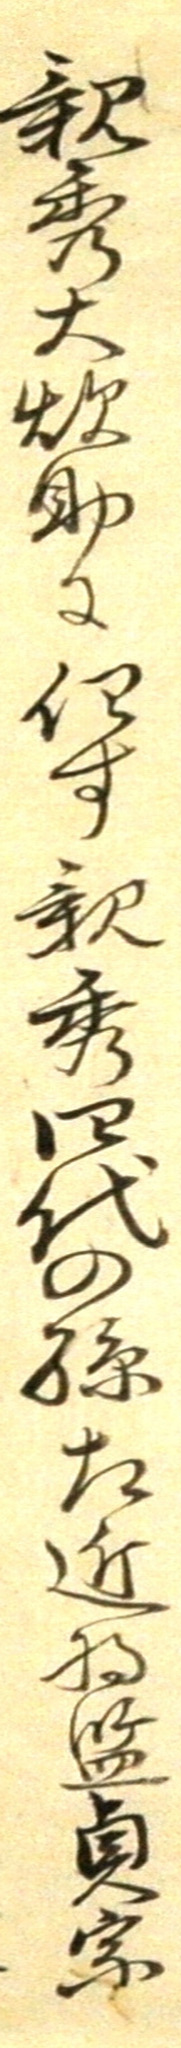親秀大炊助に任す親秀四代の孫左近将監貞宗
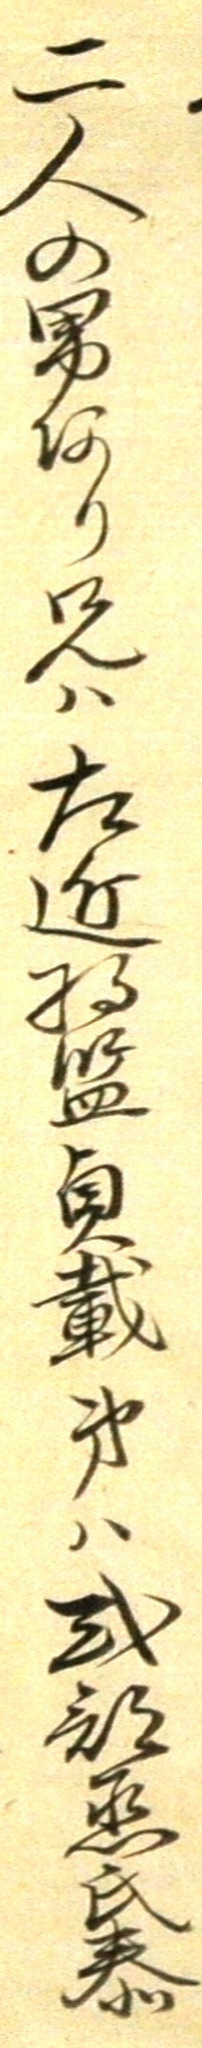二人の男あり兄は左近将監貞載弟は式部丞氏泰
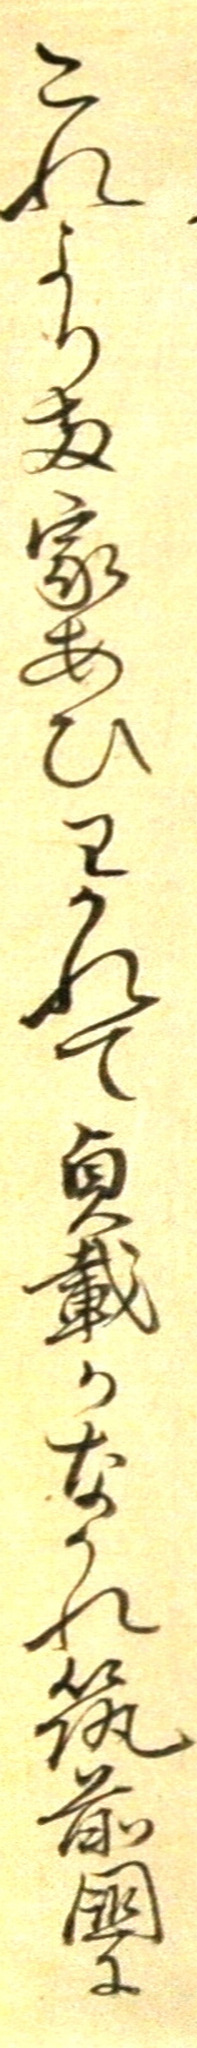これより両家あひわかれて貞載かなかれ筑前国に

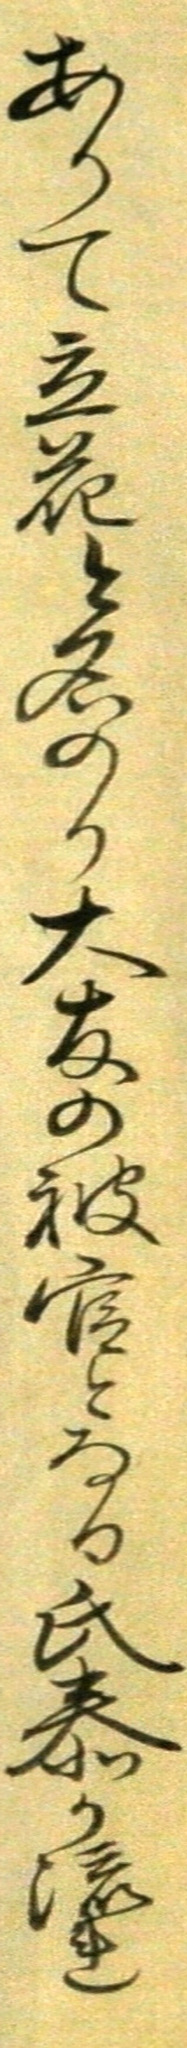ありて立花と名のり大友の被官となる氏泰か流れ
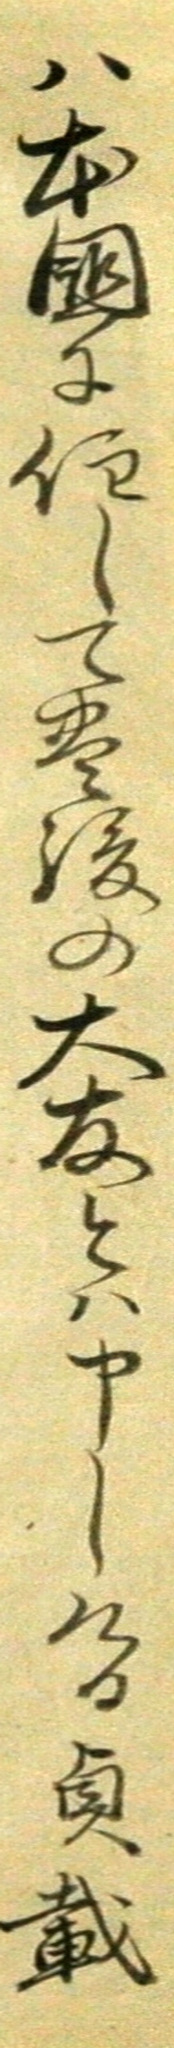は本国に住して豊後の大友とは申しける貞載
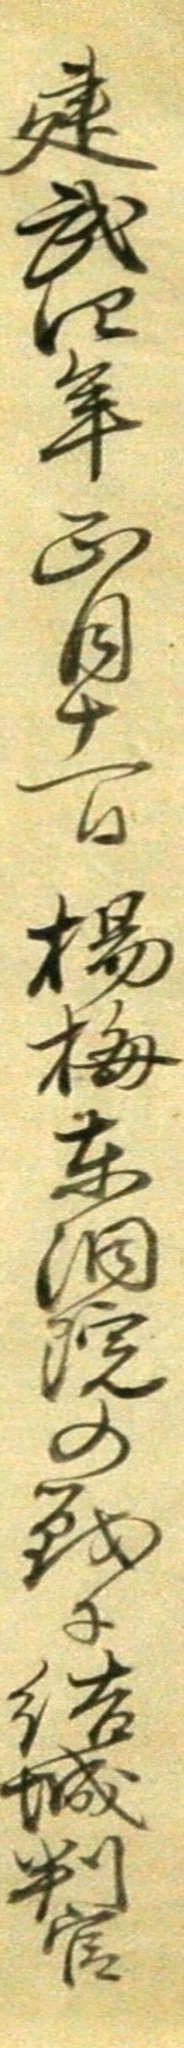建武四年正月十一日楊梅東洞院の戦に結城判官
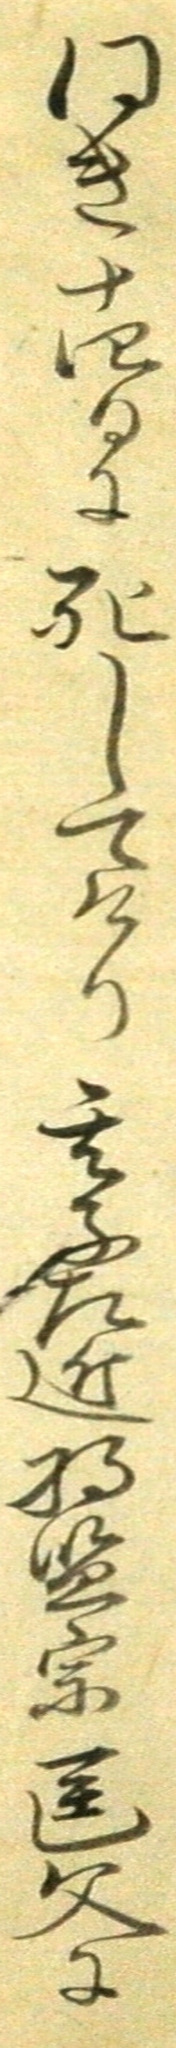同き十四日に死してけり其子左近将監宗匡父に
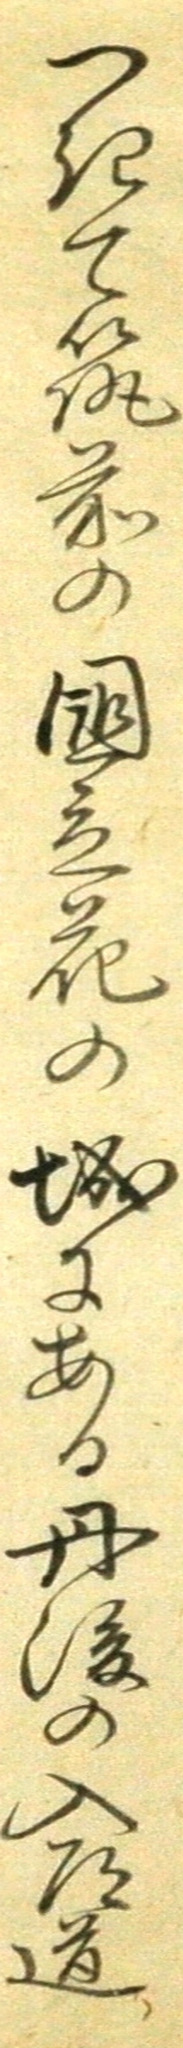つきて筑前の国立花の城にある丹後の入道道
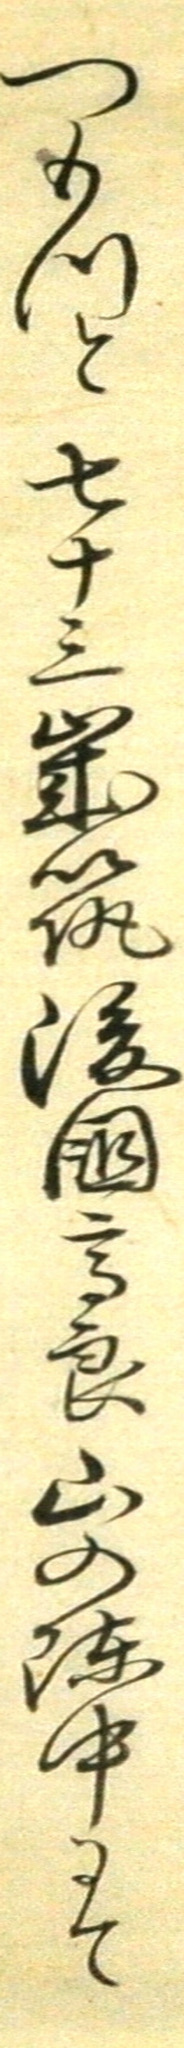つもつと七十三歳筑後国高良山の陣中にて
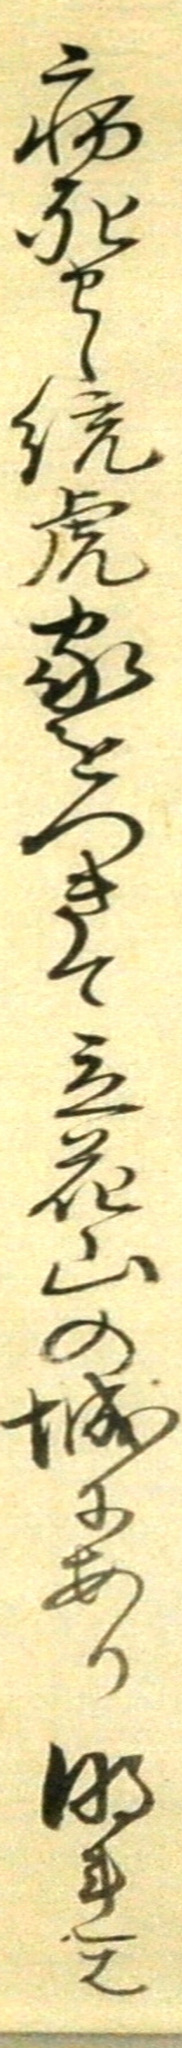病死せし統虎家をつきて立花山の城にあり明れは
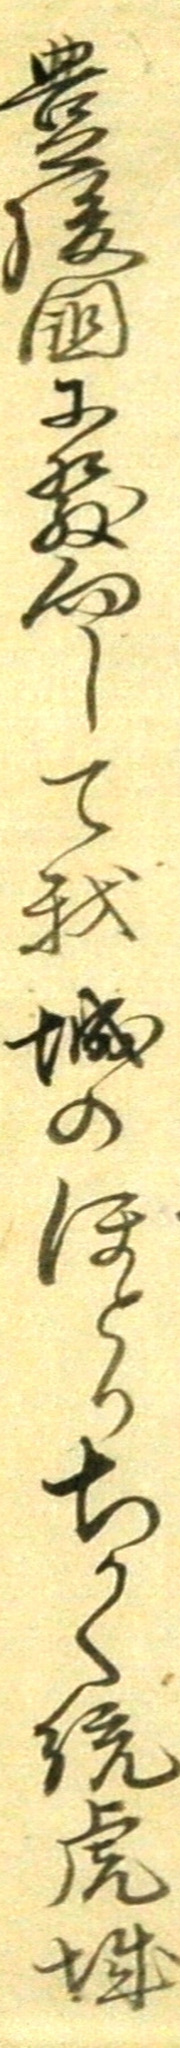豊後国に発向して我城のほとりちかく統虎城
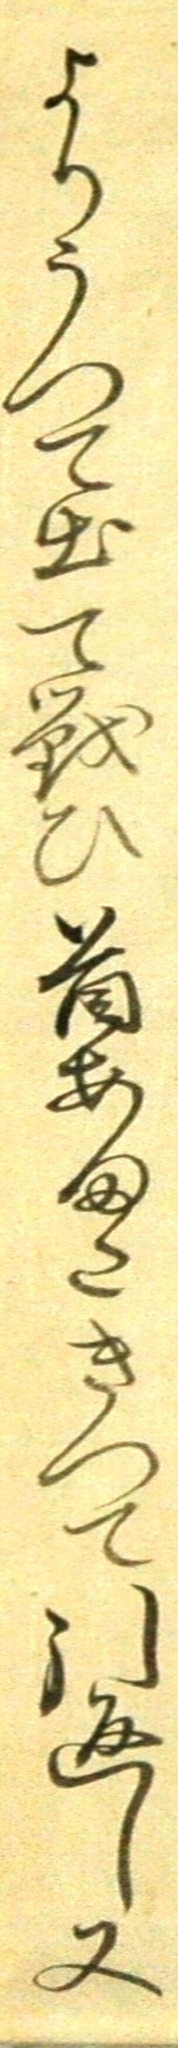よりうつて出て戦ひ首あまたきつて引返し又
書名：藩翰譜（八・下）
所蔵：伊那市立高遠町図書館・合同会社AMANE
